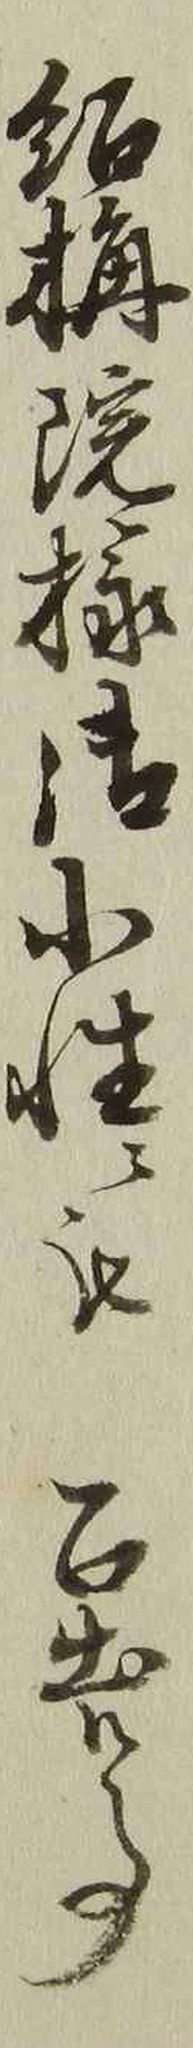紹栴院様御小姓ニ被召出候事
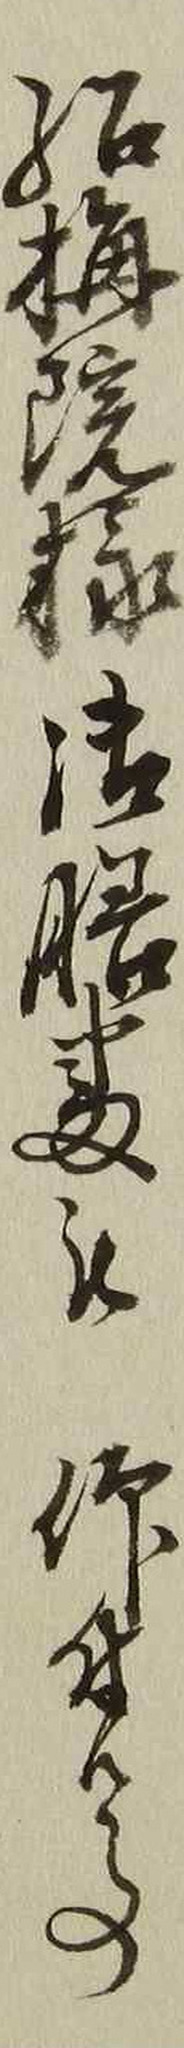紹栴院様御膳番被仰付候事
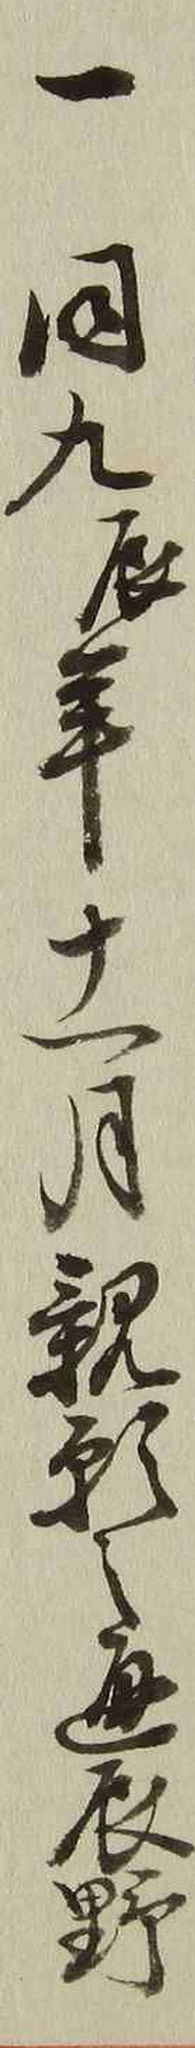一同九辰年十一月親願之通辰野
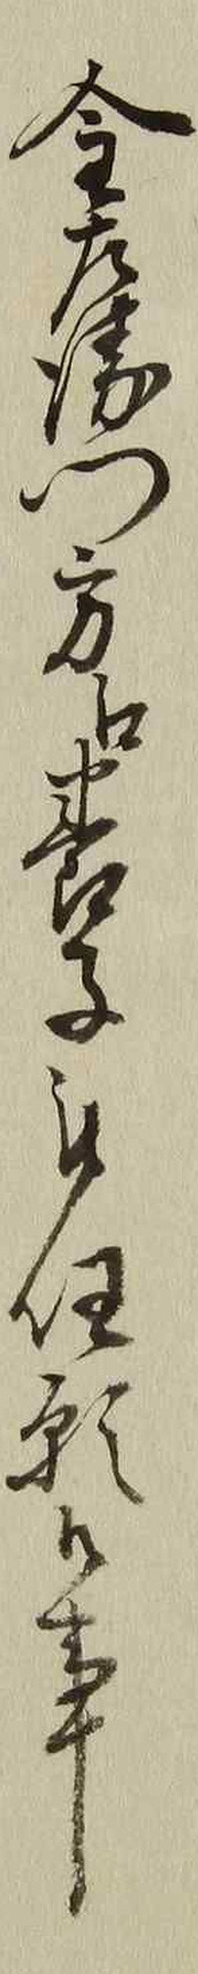金左衛門方江養子被任願候事
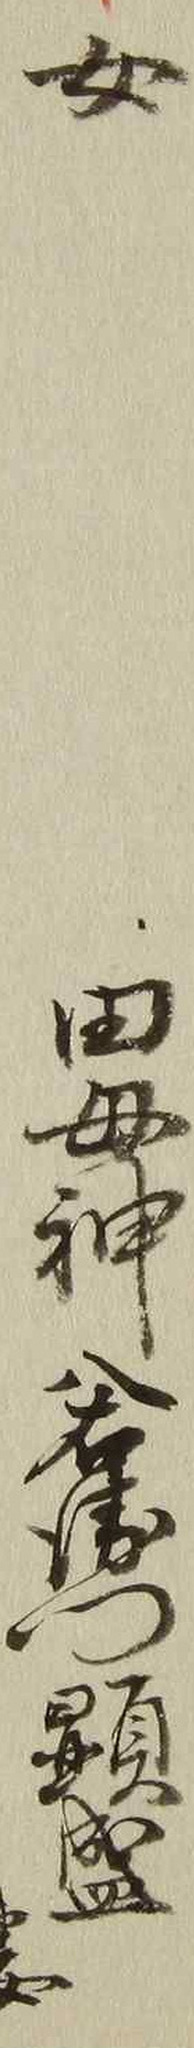女田母神八右衛門顕盛
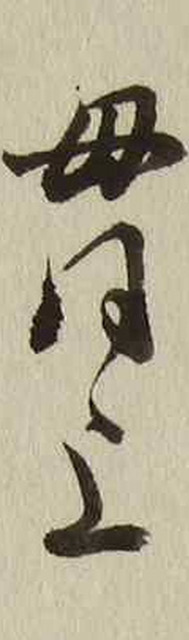母同上
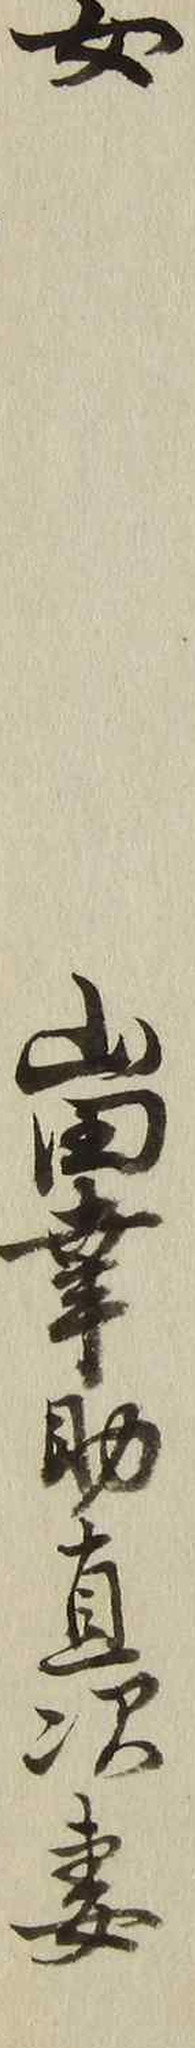女山田幸助直次妻
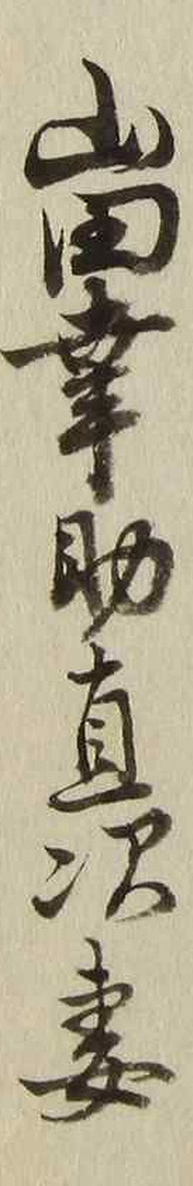女山田幸助直次妻
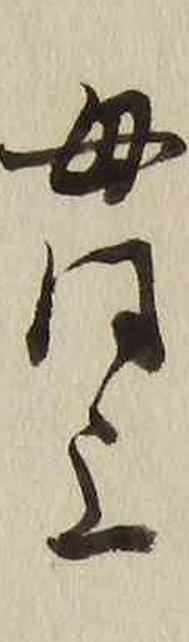母同上
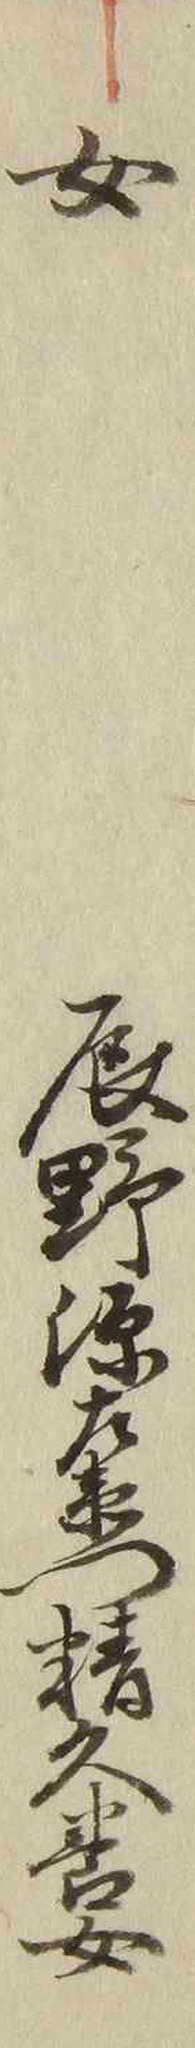女辰野源左衛門精久養女
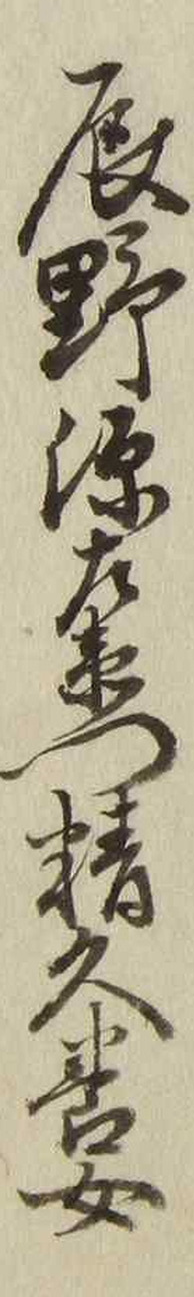女辰野源左衛門精久養女

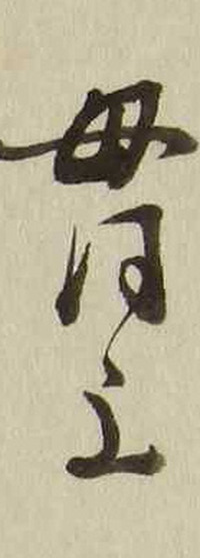母同上
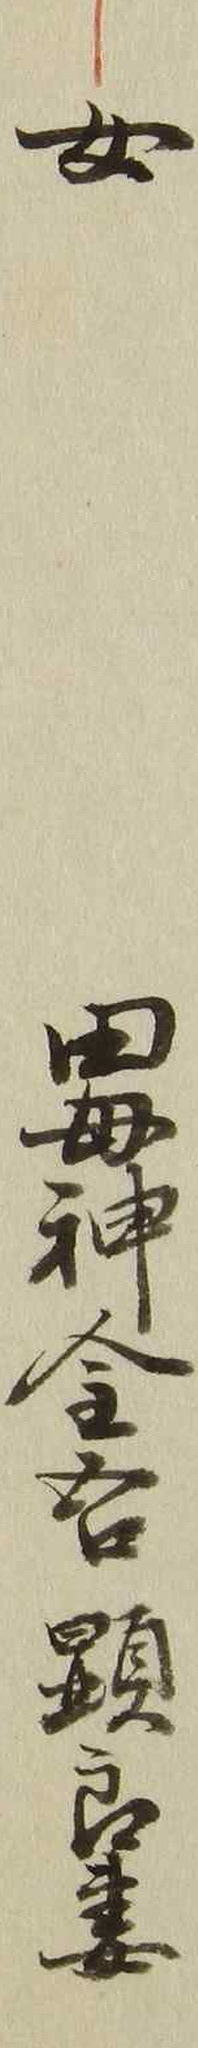女田母神金吾顕良妻
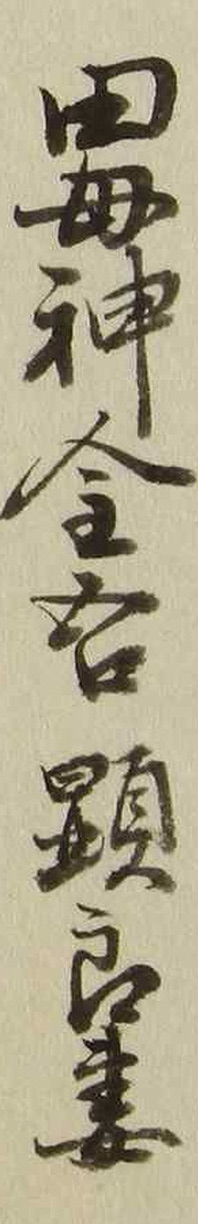女田母神金吾顕良妻
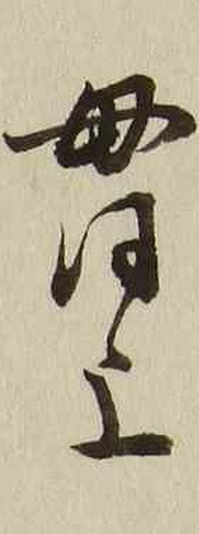母同上
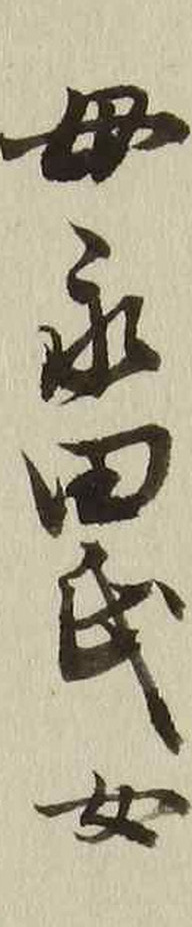母永田氏女
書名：諸士系譜　巻之31　い之部31
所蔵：会津若松市立会津図書館
